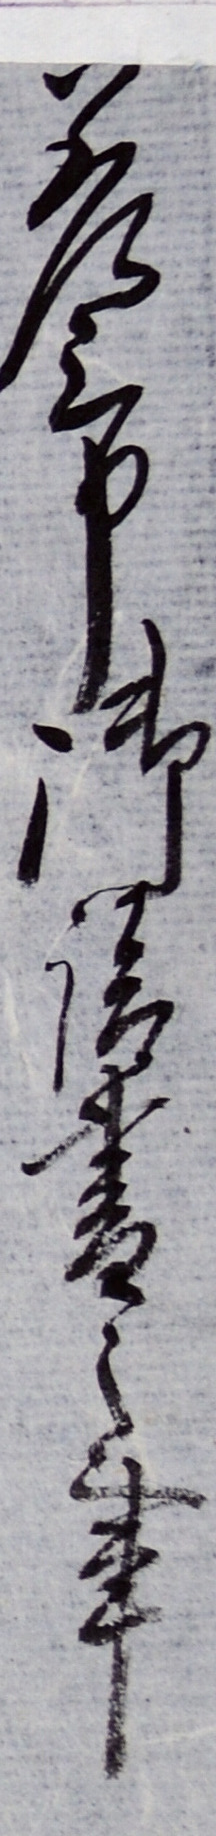差上申御請書之事
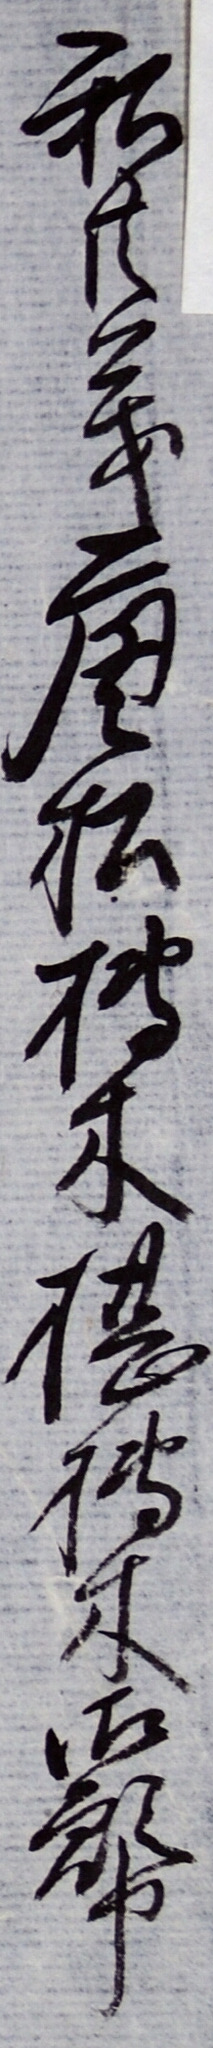私共義唐松榑木椹榑木御願申
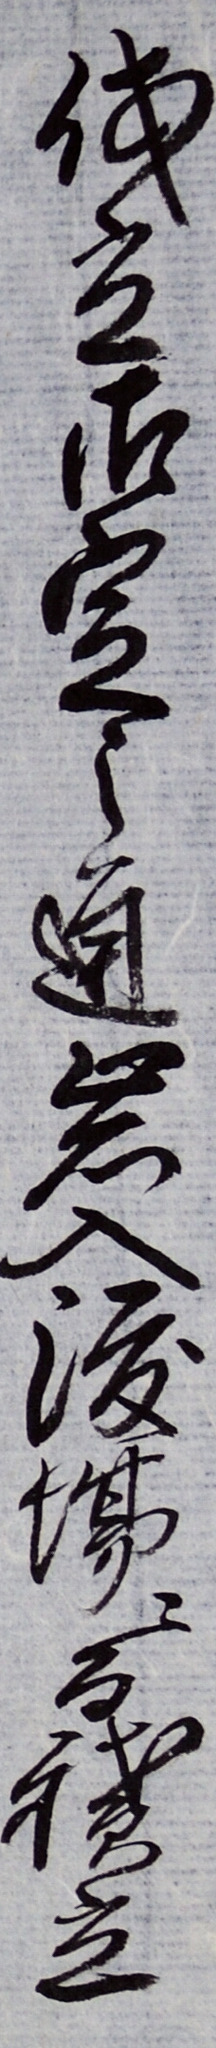伐立御定之通岩入り渡場ニ而積立
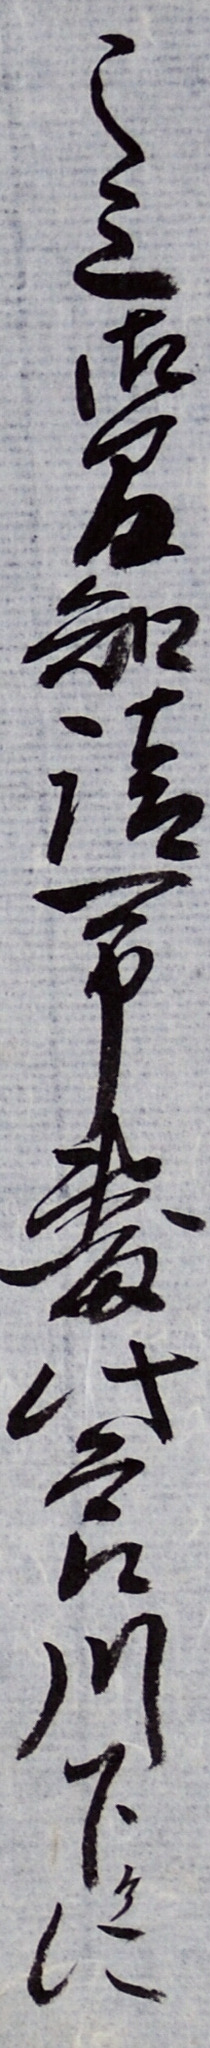之上御間知請可申處此節川下ケに
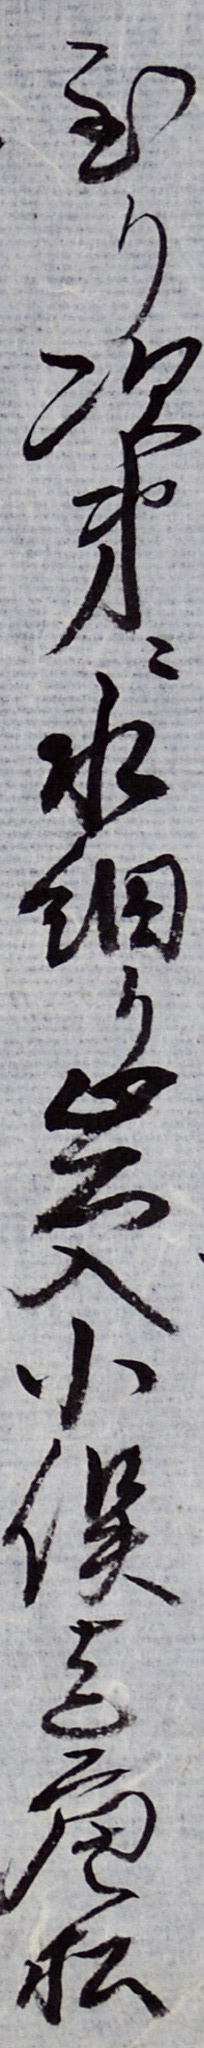至り次第ニ水細ク岩入小俣迄唐松
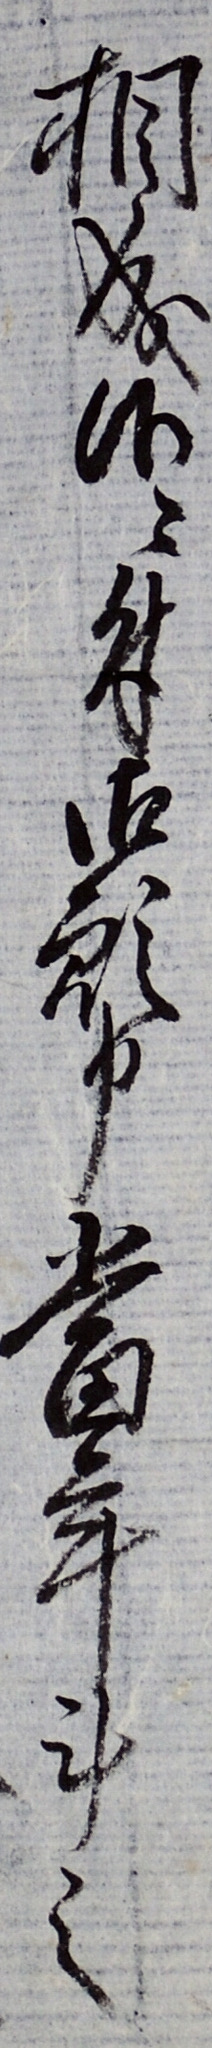相成候ニ付御願申当年斗之
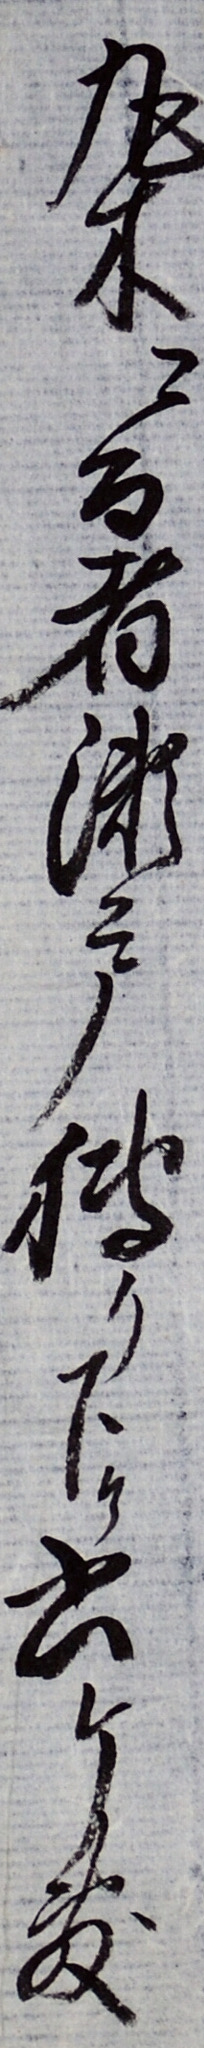丸木ニ而者瀬戸狩り下ケ六ケ敷
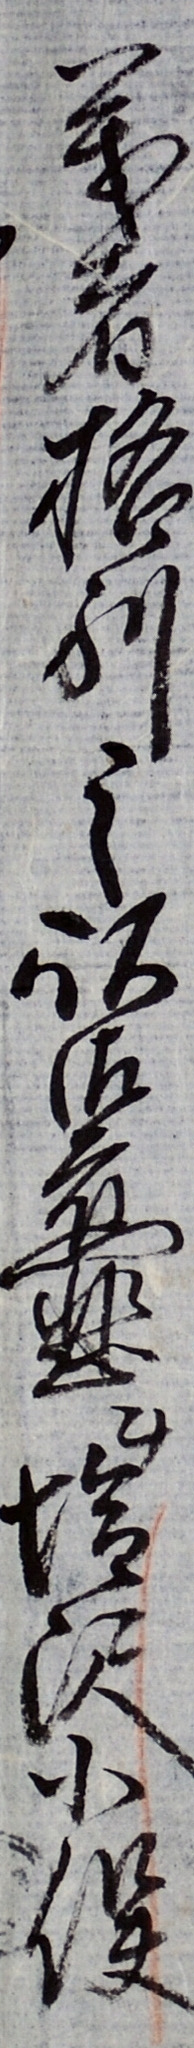義者格別之以御慈悲ヲ塩沢小俣
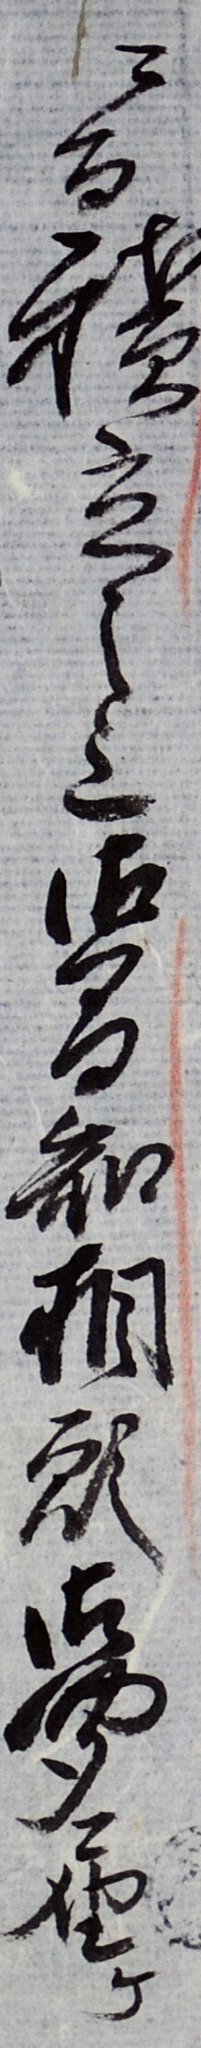ニ而積立之上御間知相願御聞届ケ
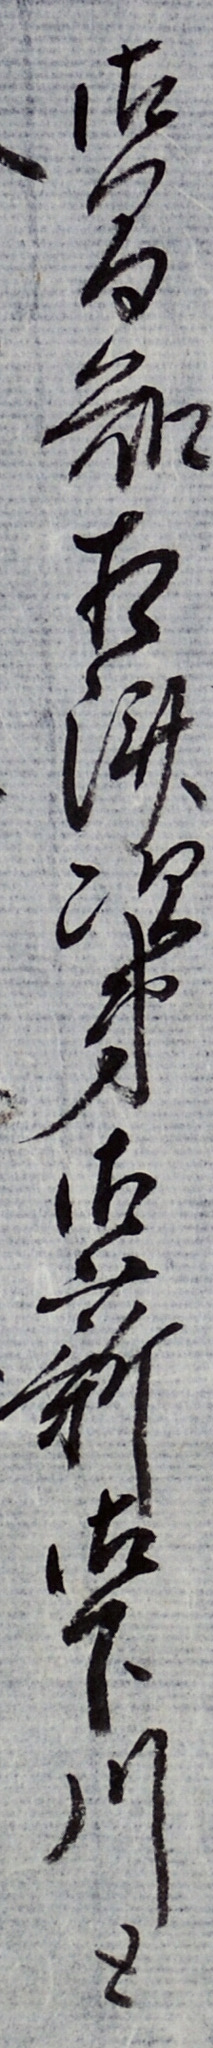御間知相済次第御薪御下川も
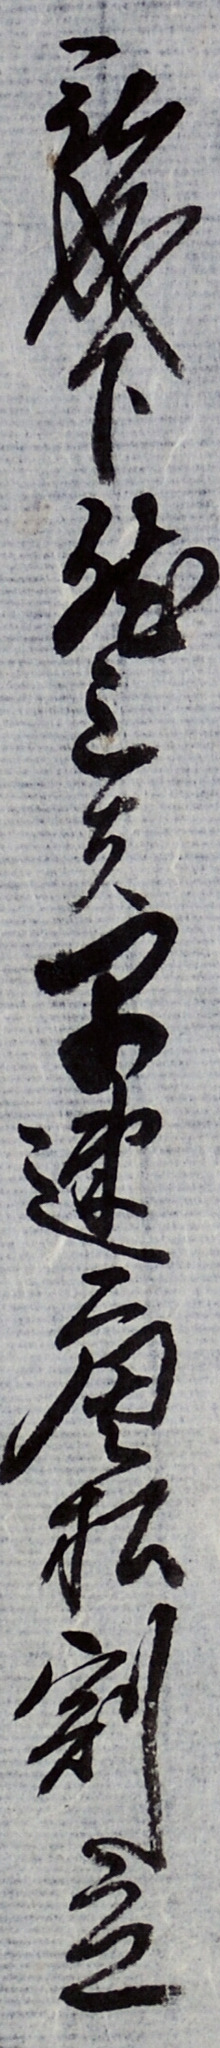被成下然上者早速唐松割立
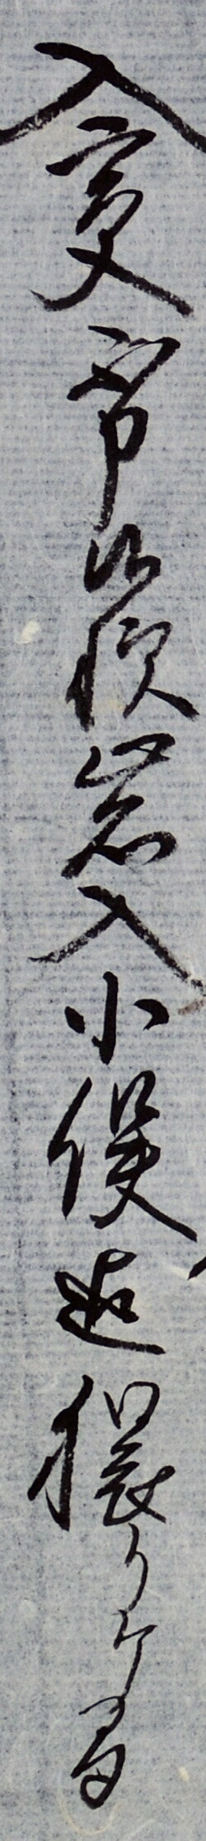入交不申候様岩入小俣迄猥りケ間
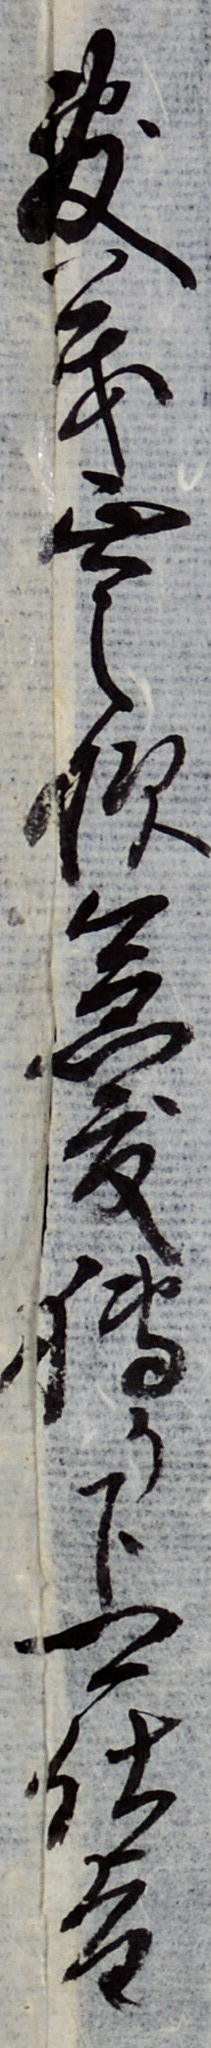敷義無之様急度狩り下可仕旨
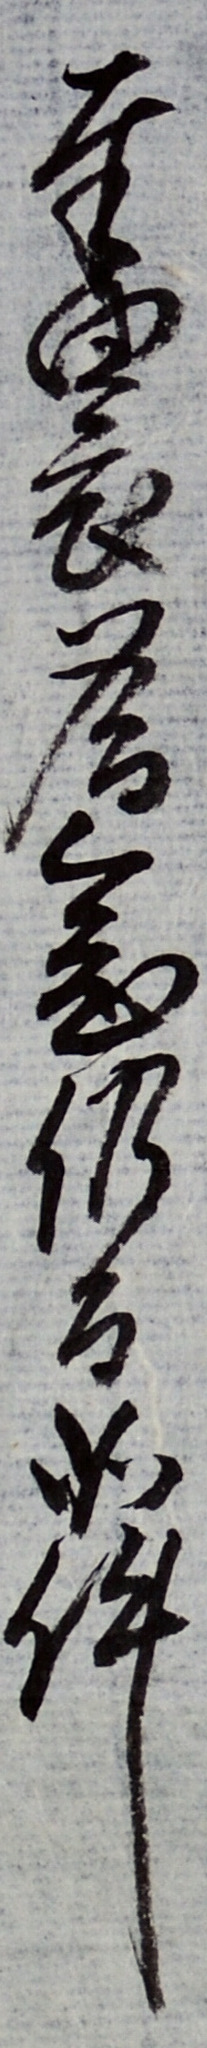奉畏為念仍而如件
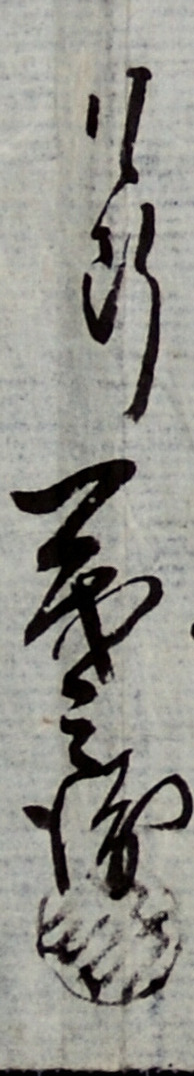同断茂兵衛㊞

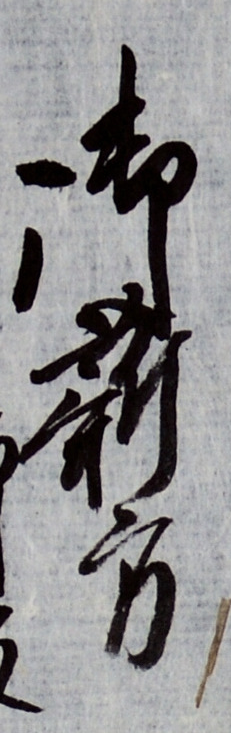御薪方
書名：差上申御請書之事
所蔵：伊那市立高遠町図書館・合同会社AMANE
